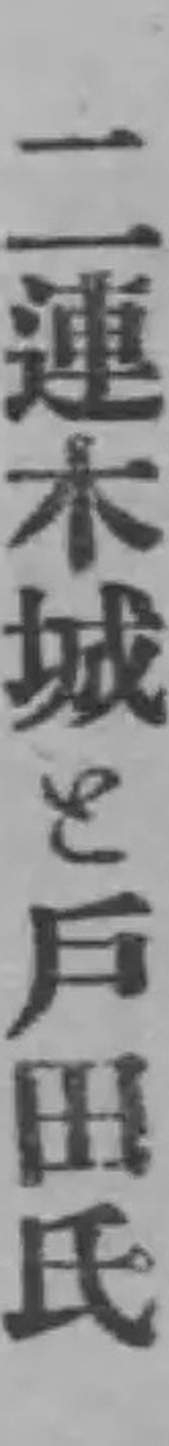二連木城と戸田氏
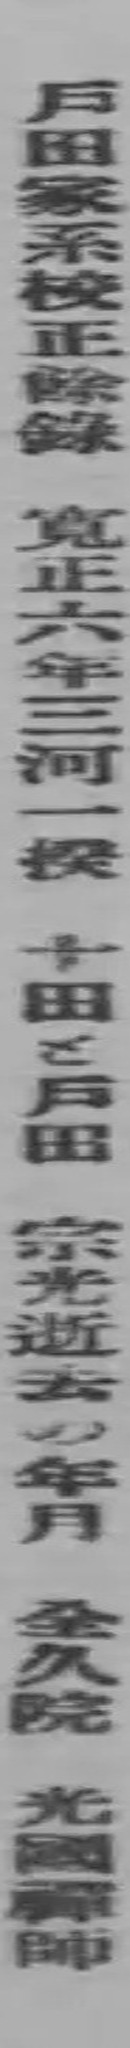戸田家系校正余録寛正六年三河一揆十田と戸田宗光逝去の年月全久院光圀禅師
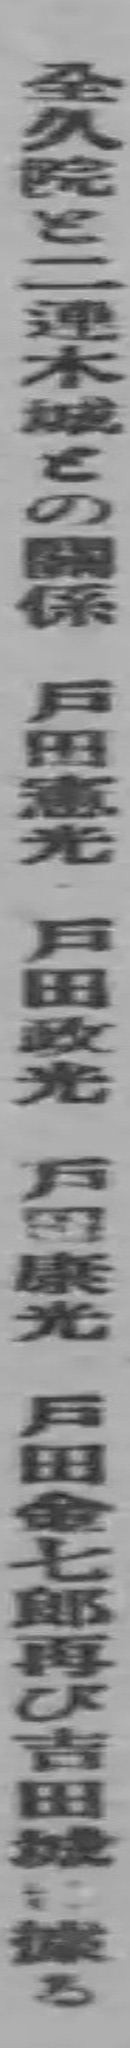全久院と二連木城との関係戸田憲光戸田政光戸田康光戸田金七郎再び吉田城に拠る
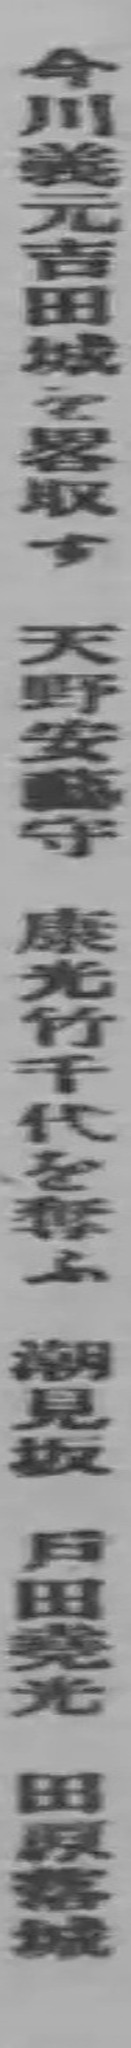今川義元吉田城を略取す天野安芸守康光竹千代を奪ふ潮見坂戸田堯光田原落城
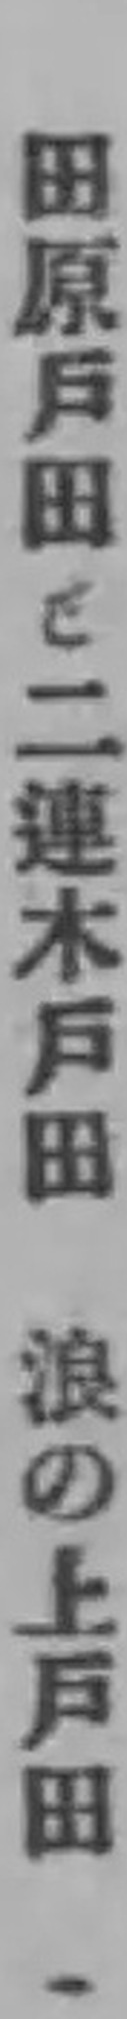田原戸田と二連木戸田浪の上戸田
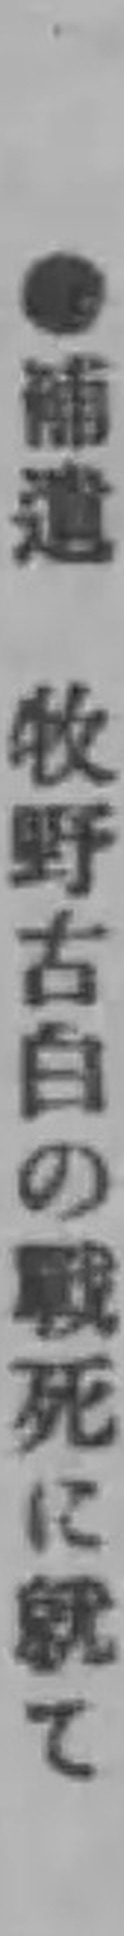●補遺牧野古白の戦死に就て
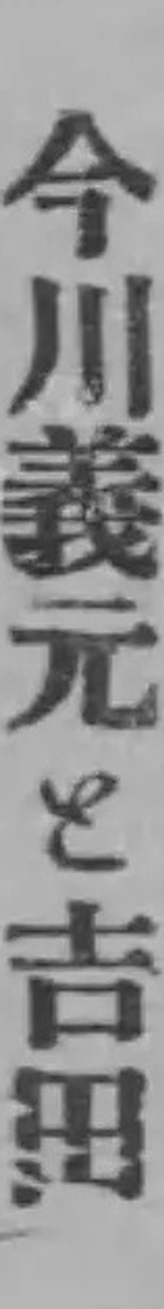今川義元と吉田
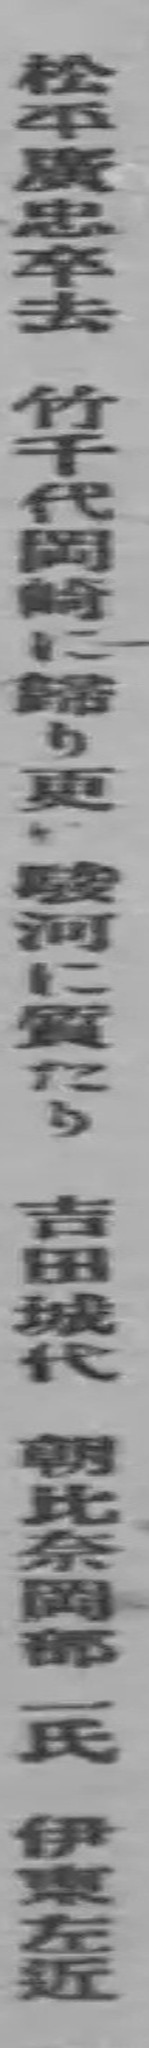松平広忠卒去竹千代岡崎に帰り更に駿河に質たり吉田城代朝比奈岡部一氏伊東左近
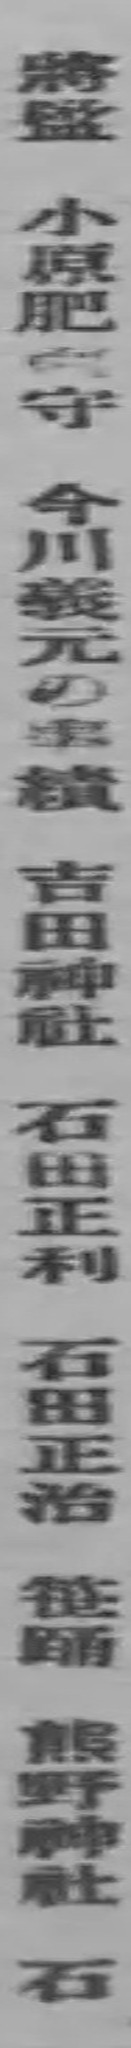将監小原肥向守今川義元の実績吉田神社石田正利石田正治笹踊熊野神社石
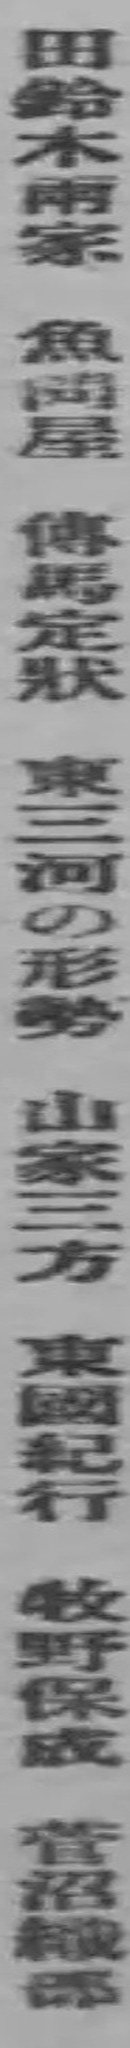田鈴木両家魚問屋伝馬定状東三河の形勢山家三方東国紀行牧野保成菅沼織部
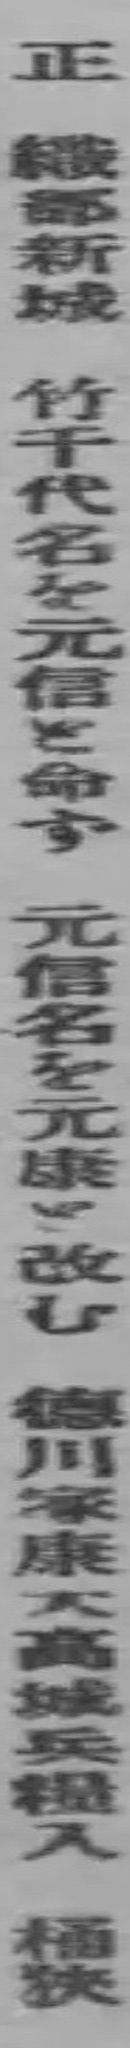正織部新城竹千代名を元信と命ず元信名を元康と改む徳川家康大高城兵糧入桶狭
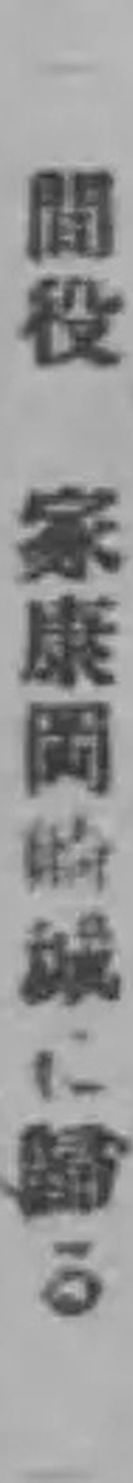間役家康岡崎城に帰る
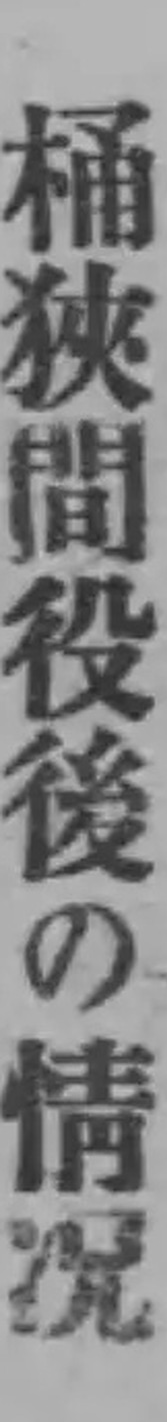桶狭間役後の情況
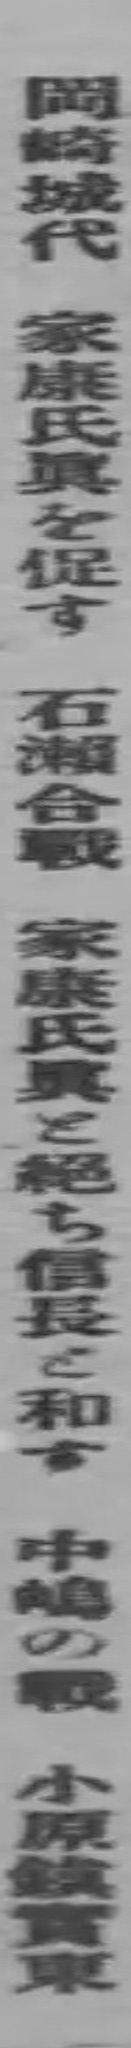岡崎城代家康氏眞を促す石瀬合戦家康氏眞と絶ち信長と和す中嶋の戦小原鉄実東
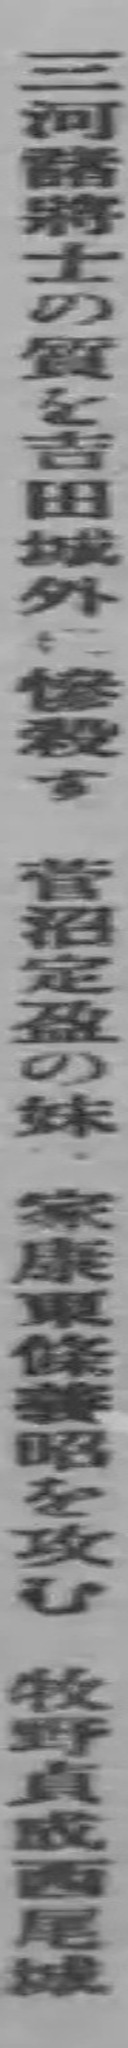三河諸将士の質を吉田城外に惨殺す菅沼定盈の妹家康東條義昭を攻む牧野貞成西尾城
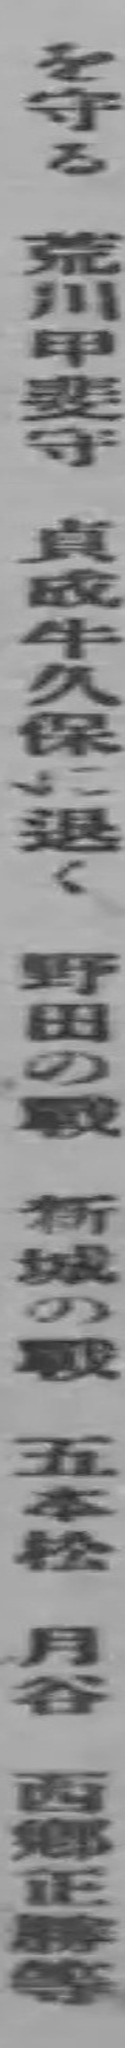を守る荒川甲斐守貞成牛久保に退く野田の戦新城の戦五本松月谷西郷正勝等
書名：豊橋市史談
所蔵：国立国会図書館 National Diet Library, JAPAN
